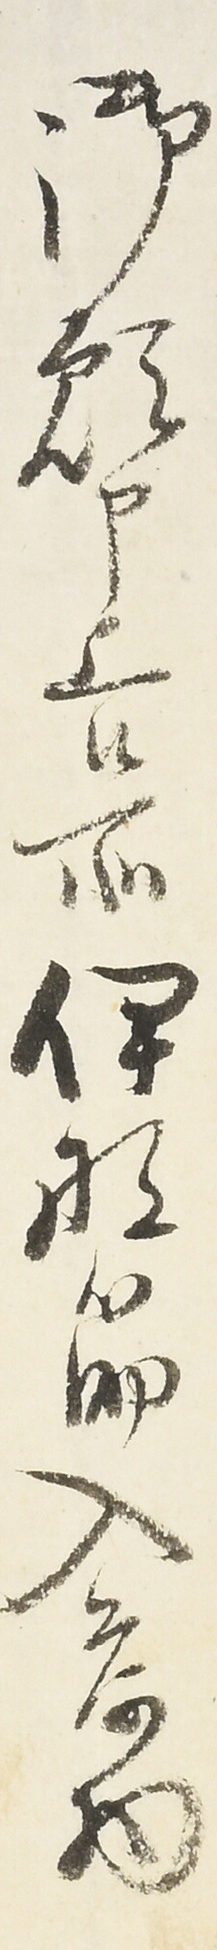御願申上候所伊那筋入荷物
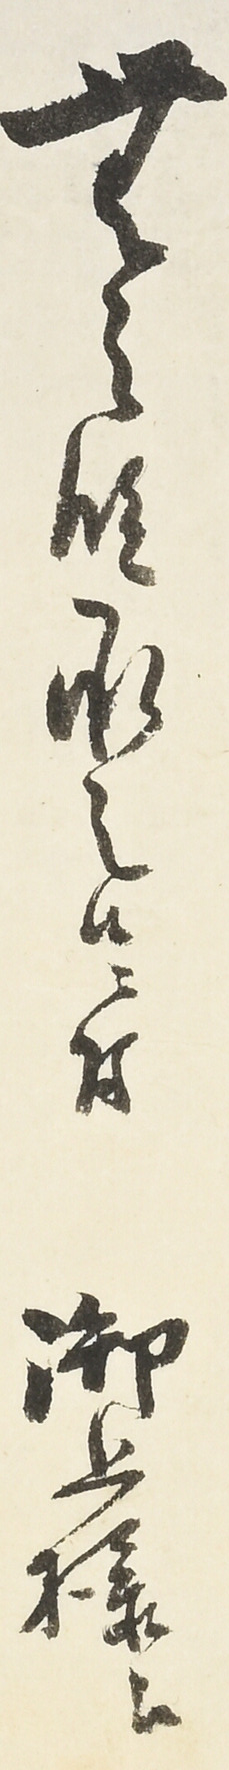無之段承之候に付御上様え
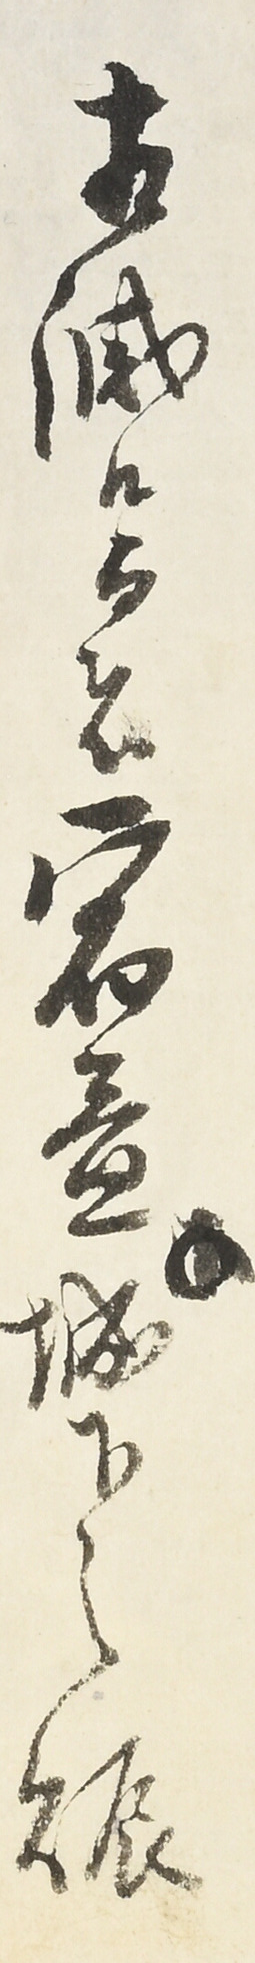相減候而は宿益城下之賑
